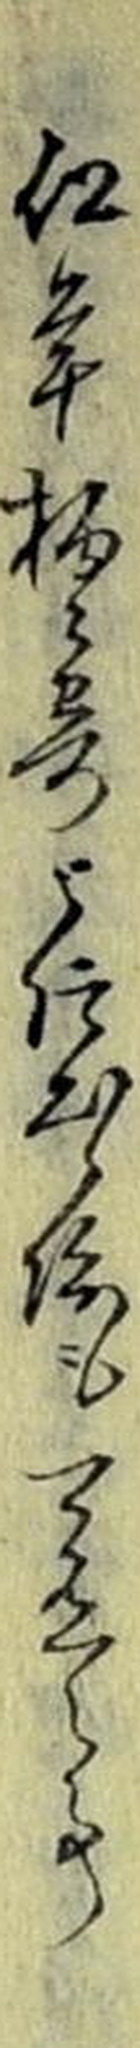但年柄に寄被仰出候儀も可有之事
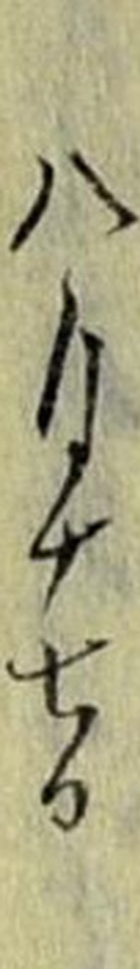八月十七日
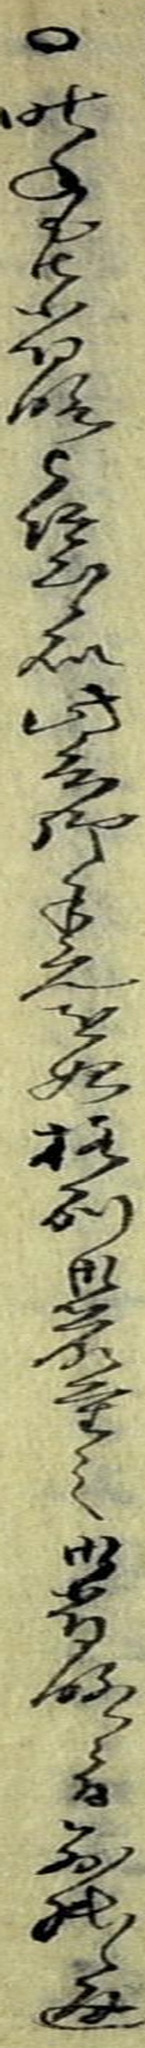○昨年も御省略被仰出候処此度御手元を始各別御厳重之御省略に付別紙之通
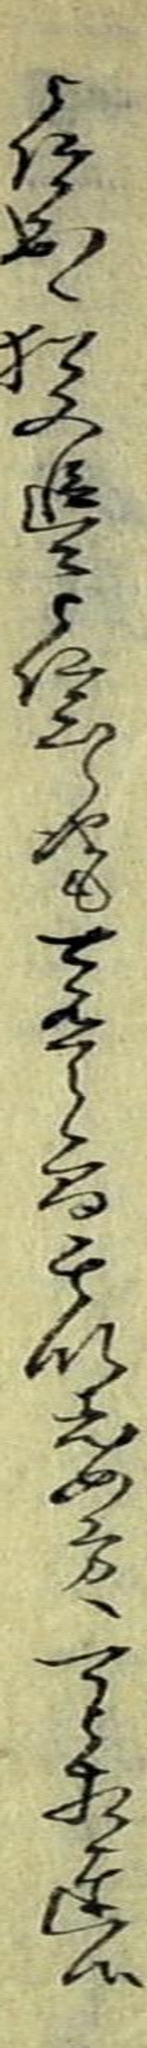被仰出候猶又追々被仰出候儀も可有之候間其段老女方へ可被相達候
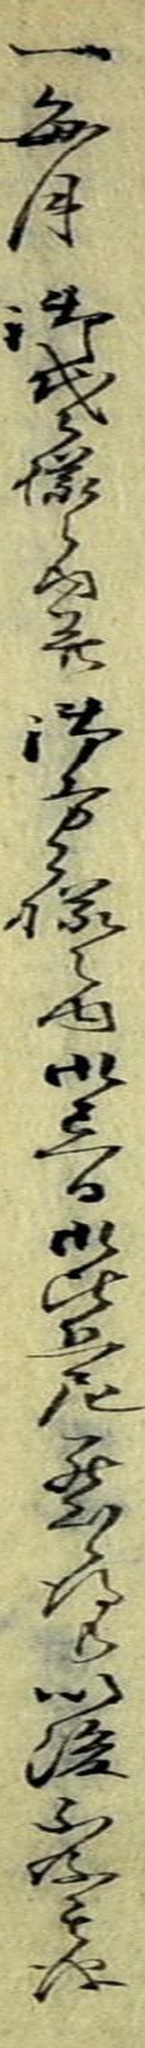一毎月御代々様之内并御方々様之内御忌日御比丘尼罷出候得共以後不及其儀
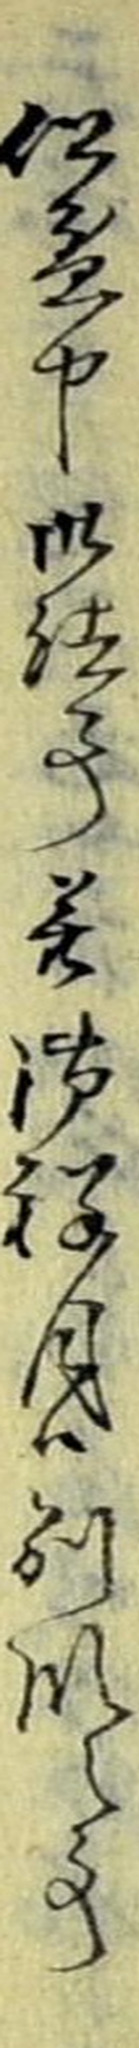但盆中御法事并御祥月は別段之事

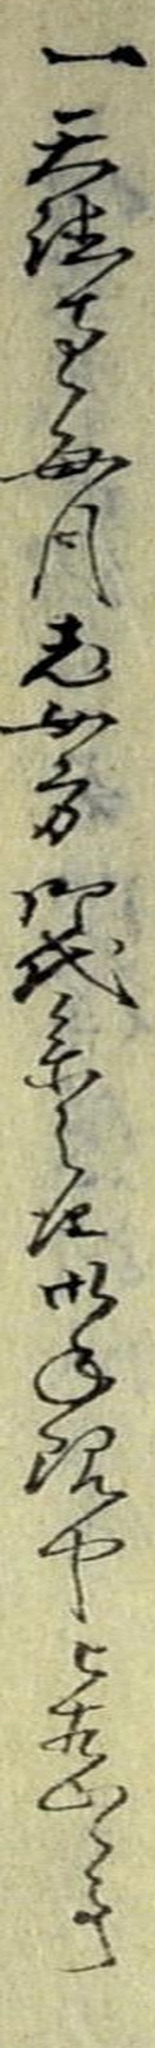一天徳寺毎月老女方御代参之儀御年限中被相止候事
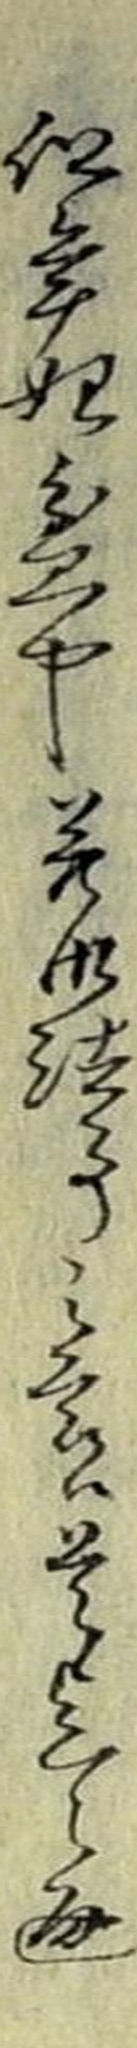但年始盆中并御法事之節は是迄之通
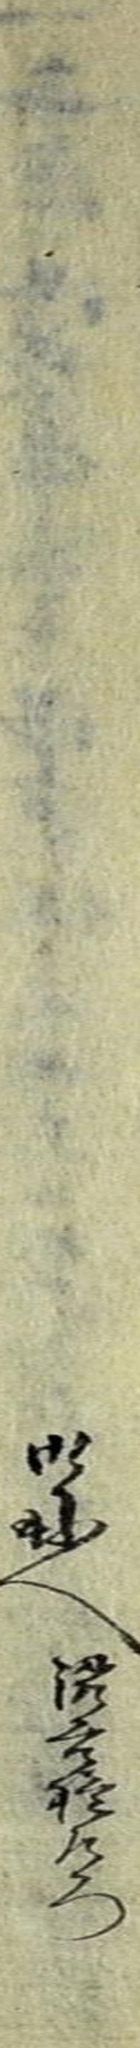御用人渋谷権左衛門
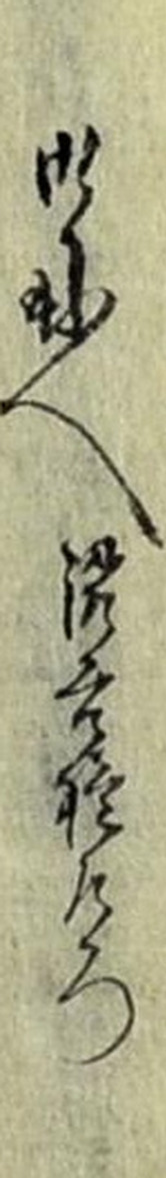御用人渋谷権左衛門
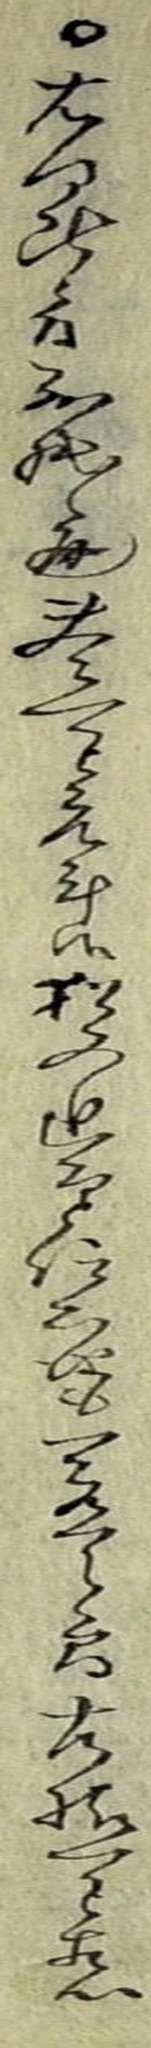○右同断に付別紙之通夫々可被取斗候猶又追而被仰出候儀も可有之候間左様可被相心
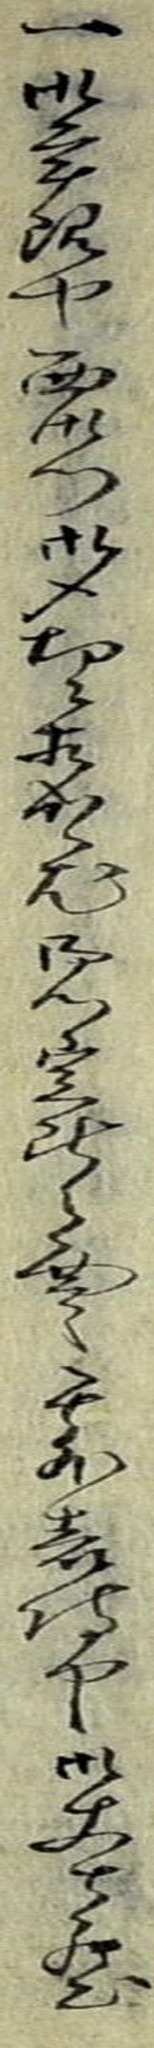一御年限中西御門御〆切に相成候尤御門定断之面々其外表侍中御使者罷出
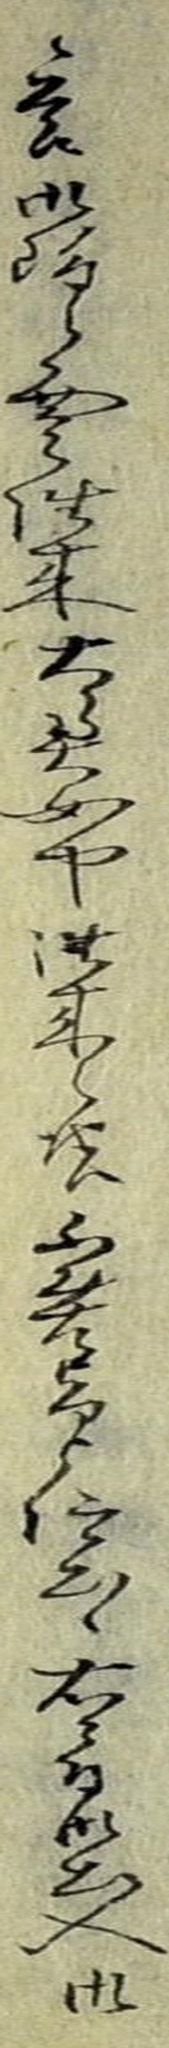候節御附之面々往来大奥女中往来之儀は不苦旨被仰出候右に付御出入御
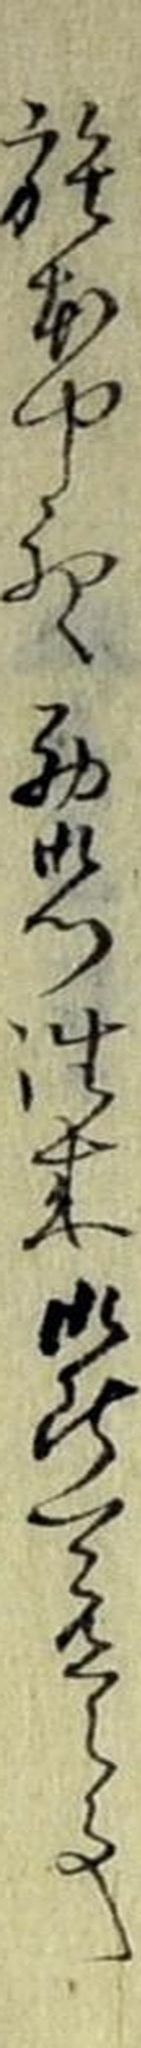旗本中初へ西御門往来御断可有之候事
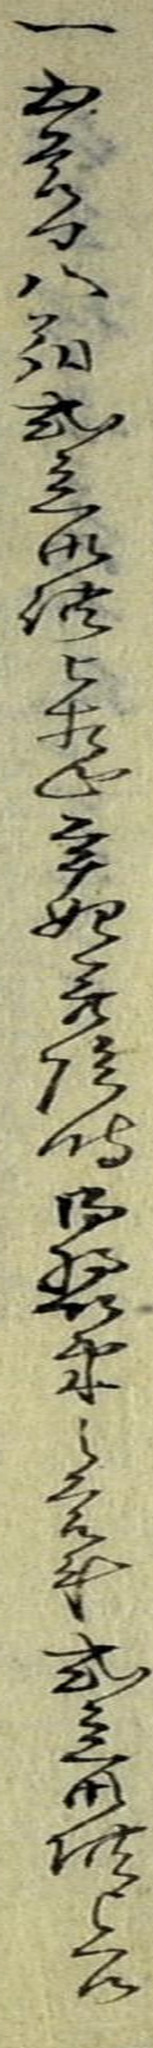一五節句八朔式立御供被相止年始并臨時御装束之節斗式立御供被召
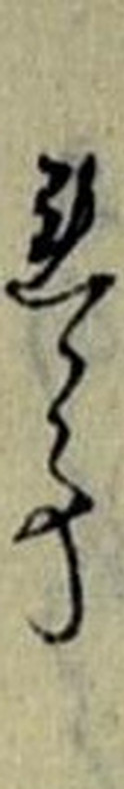連候事
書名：命令之部 六
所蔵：福井県文書館 Fukui Prefectural Archives
